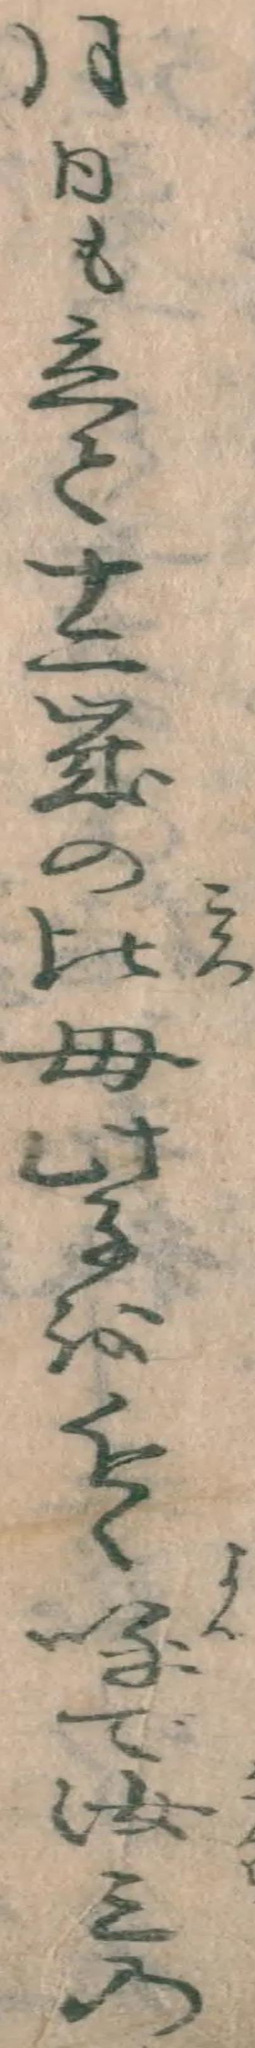月日も立て十二歳の頃母此子を近く呼で汝三の
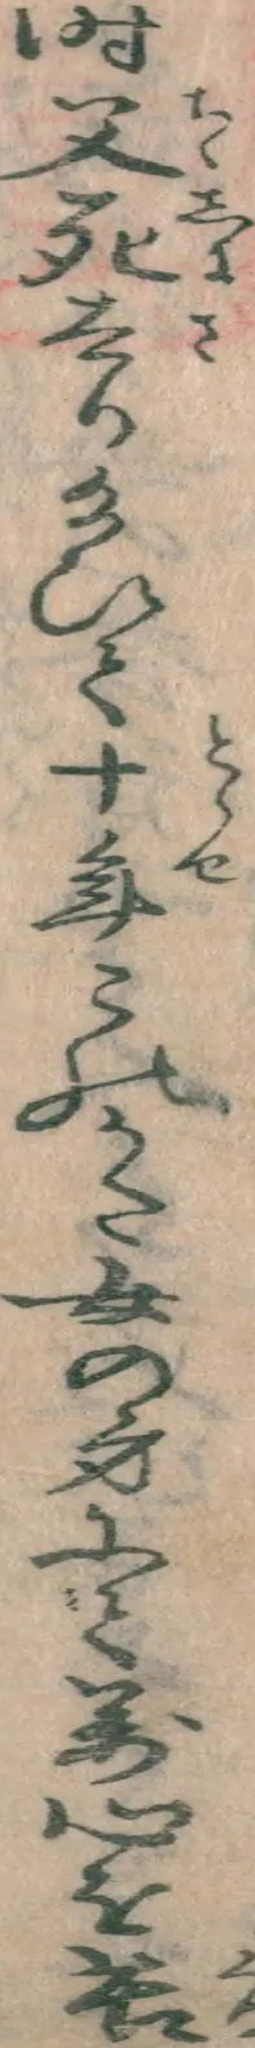時父死去り給ひて十年このかた女の身にて万心を苦
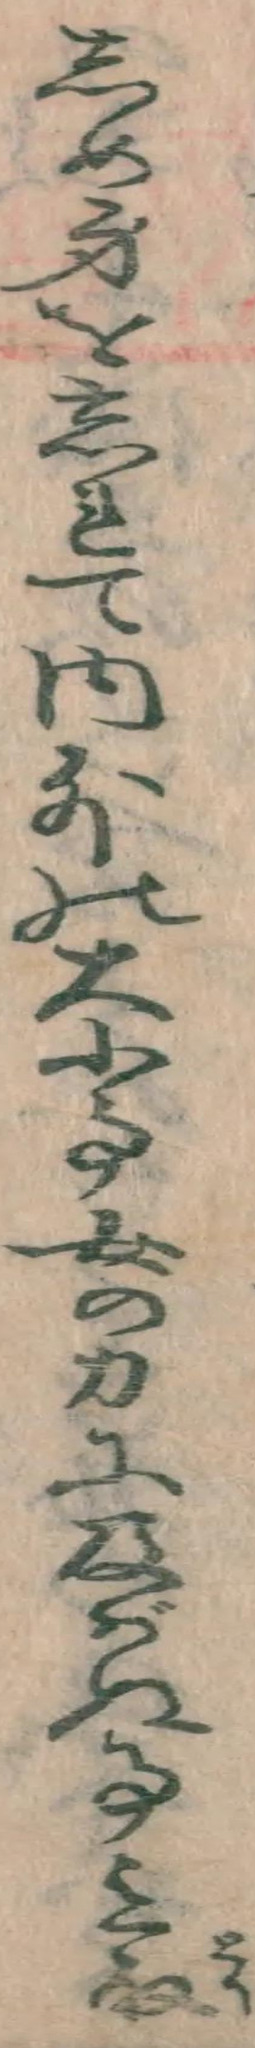しめ身を忘れて内外の大小事女の力に及ばぬ事迄取
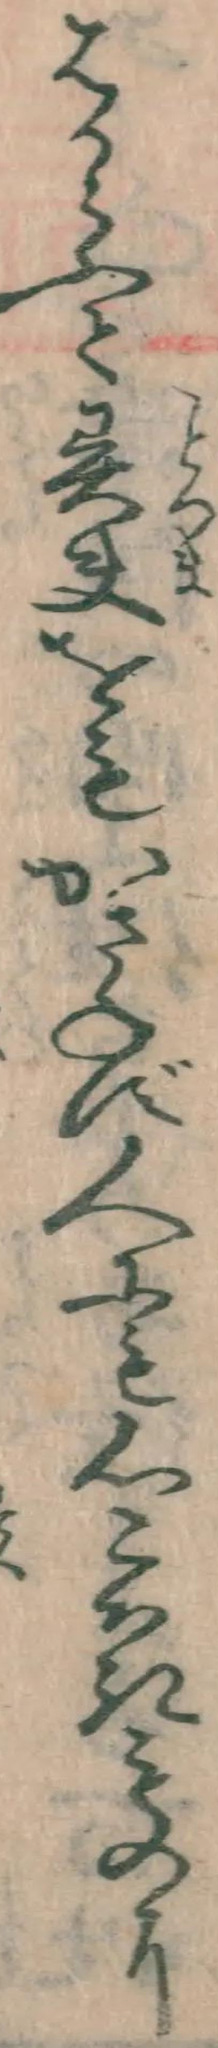はからふて異夫をもかさねず人にも心こはきものに
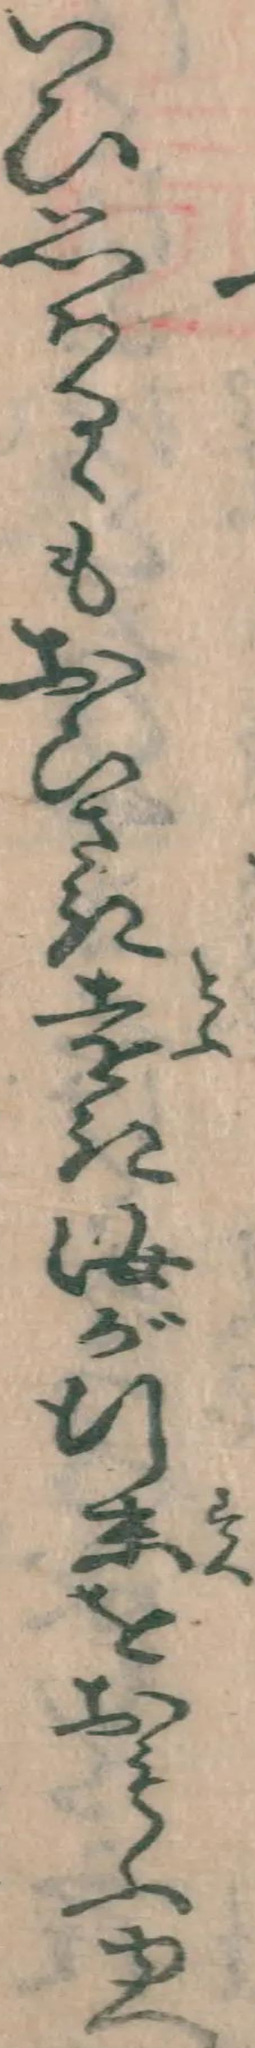いひ思はるゝもおひさき貴き汝が行末をおもふゆへ
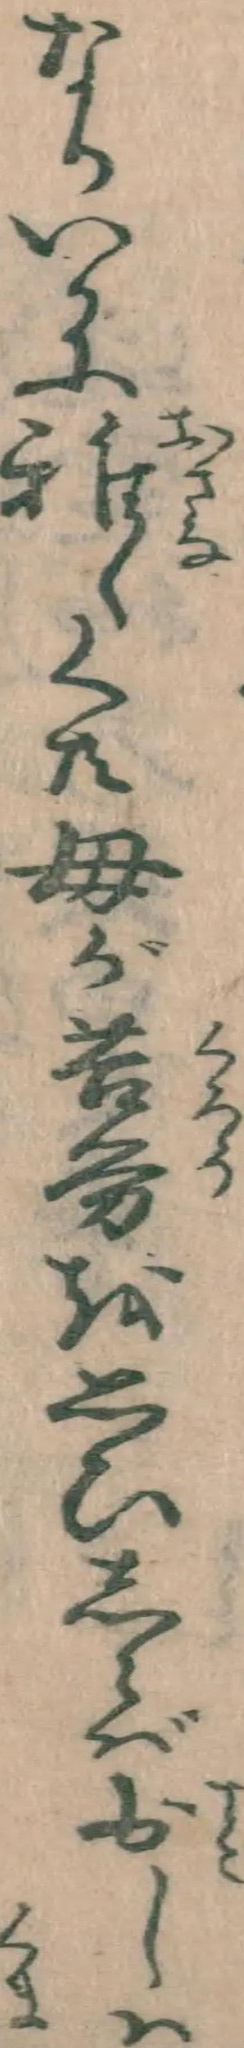なりいかに稚く共母が苦労を思ひしらば少しは
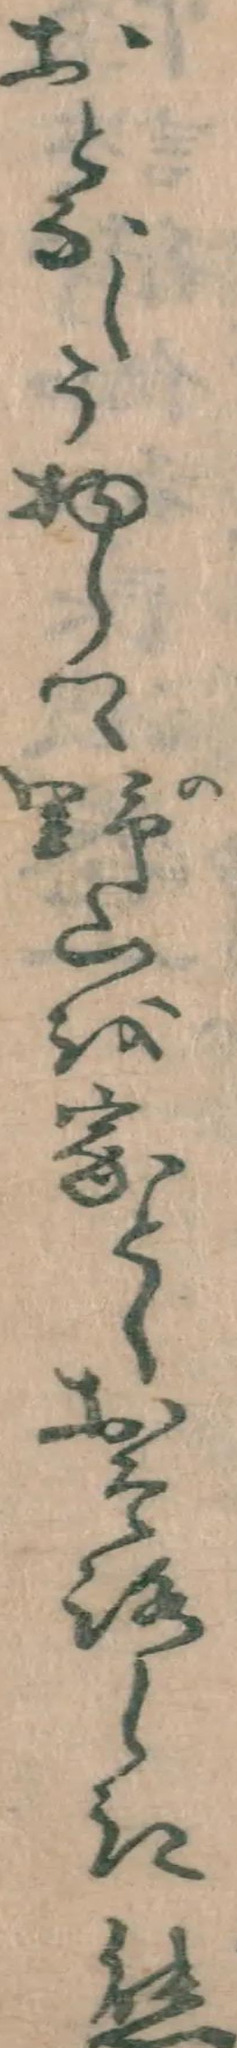おとなしう物しつゝ野山を家としおそろしき熊
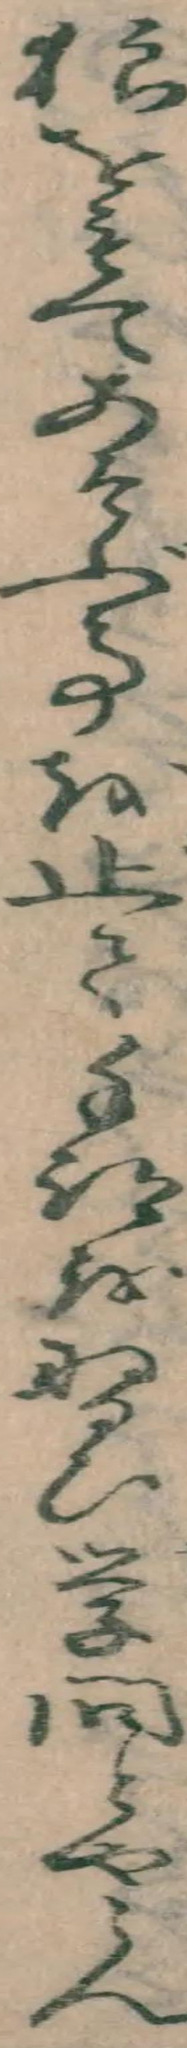狼をもてあそぶ事を止て手跡を習ひ学問とやらん
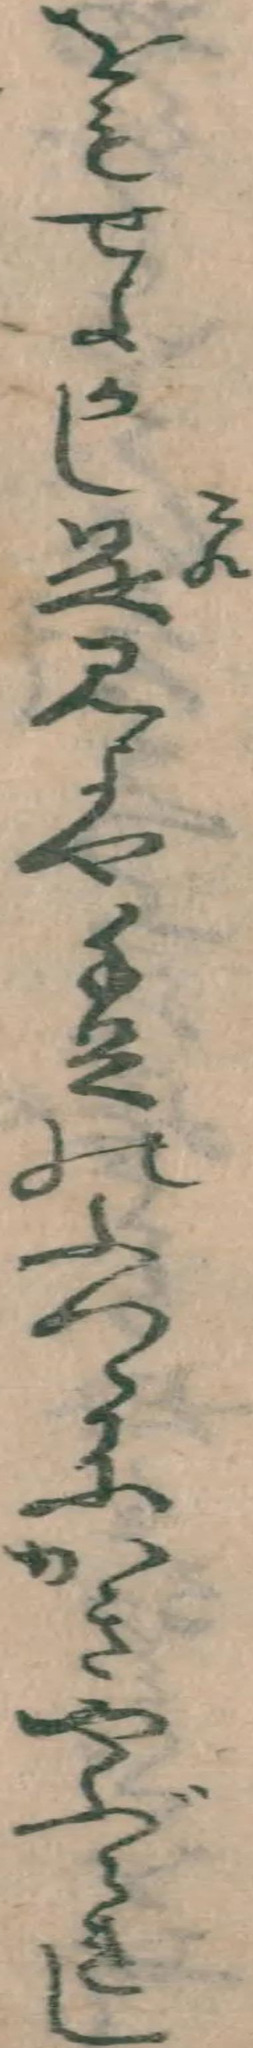をもせよかし是見よや手足のふつゝかにかきやぶられし
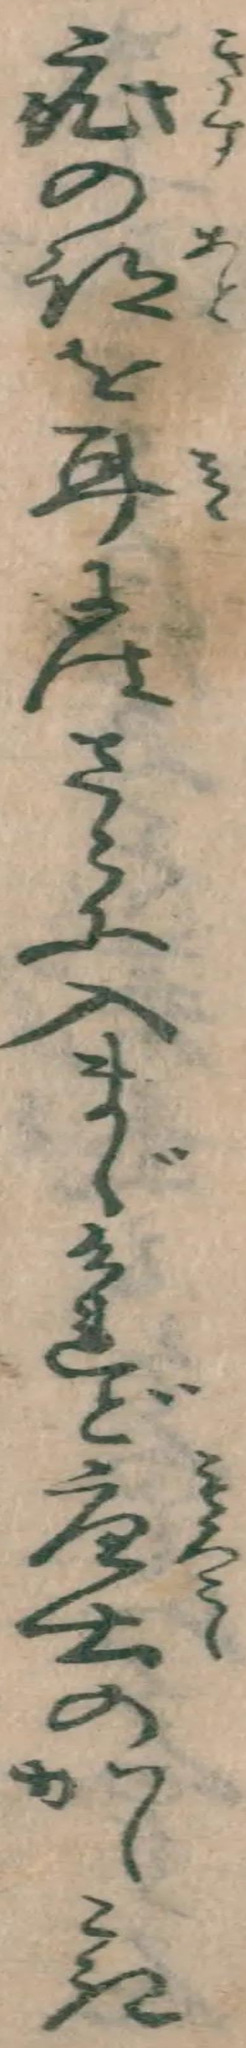疵の跡を耳にはさらに入まじけれど唐土のかしこき
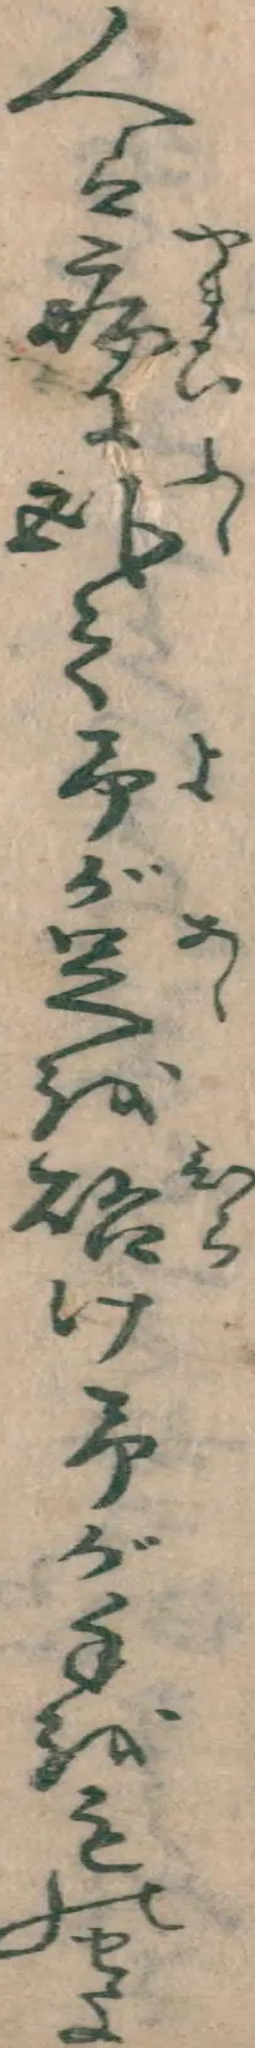人は病に臥て予が足を啓予が手をものせよ
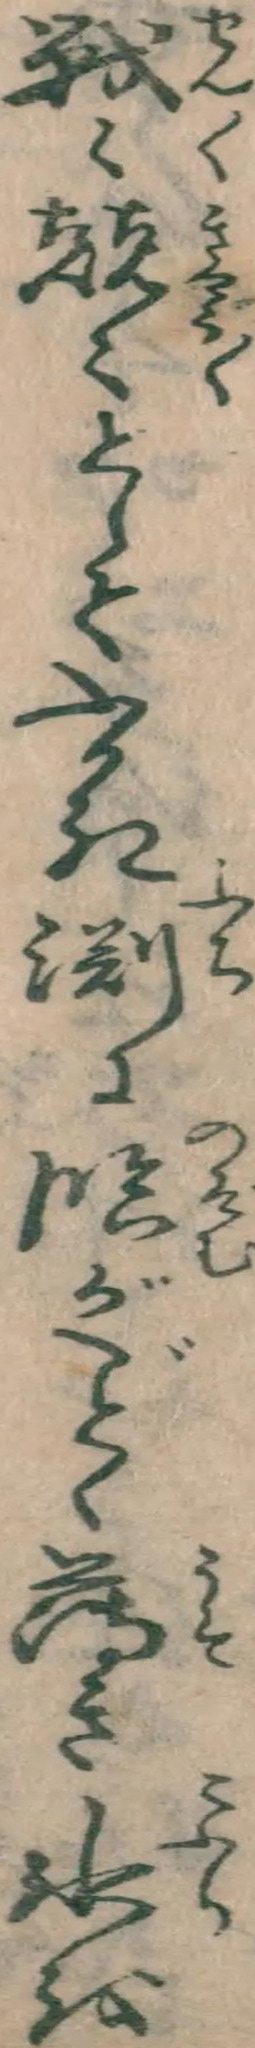戦々兢々としてふかき渕に臨がごとく薄き氷を
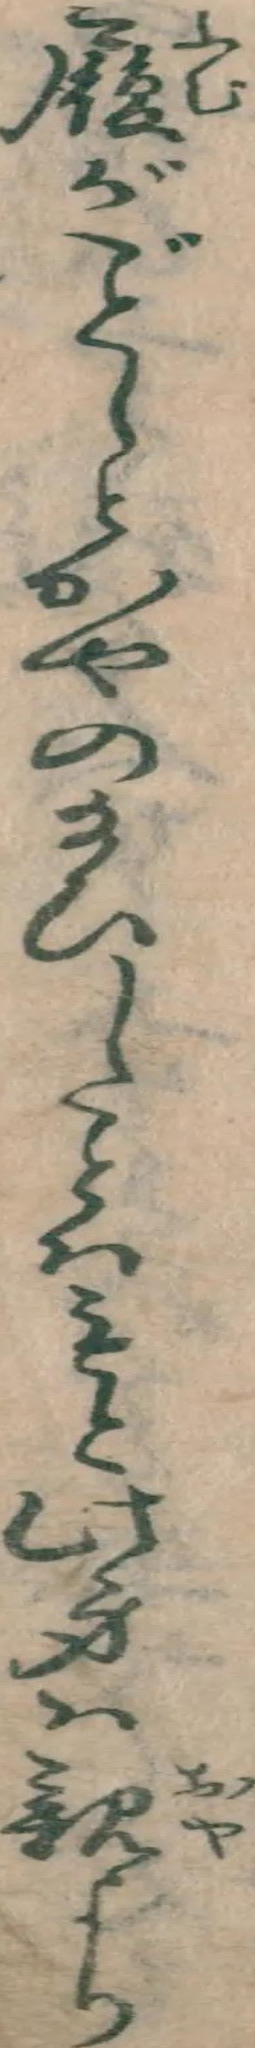履がごとしとかやの給ひしことはもと此身は親より
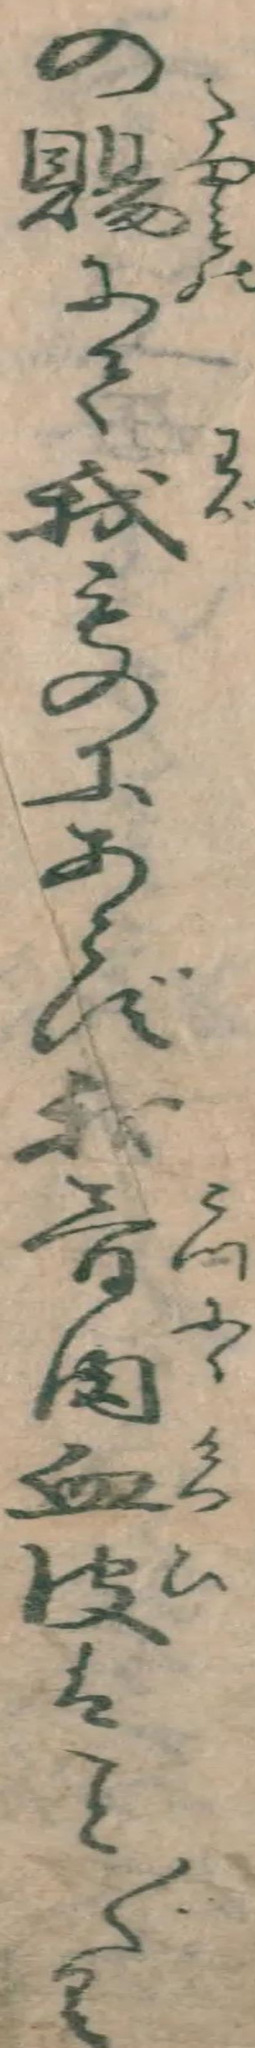の賜にて我ものにあらず我骨肉地皮はこと〴〵く
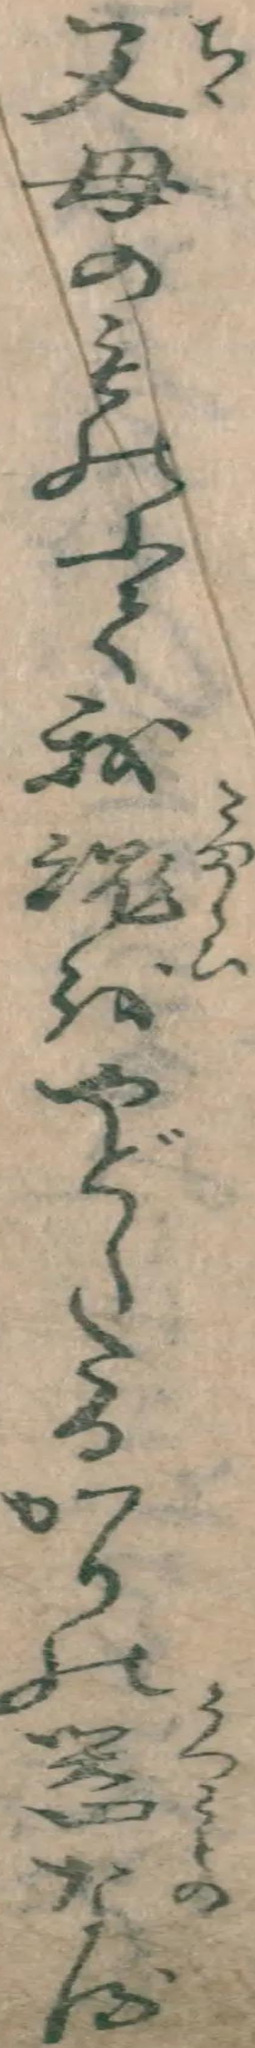父母のものにて我魂をやどしたるかりの器なる
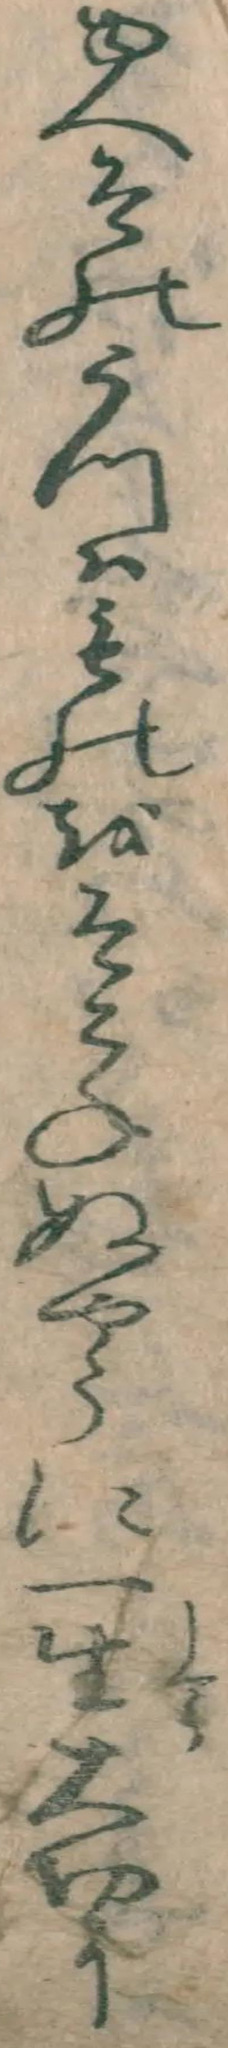ゆへそのうつはものをそこねぬやうに一生大切に
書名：怪談御伽童 5巻. [1]
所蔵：国立国会図書館 National Diet Library, JAPAN
